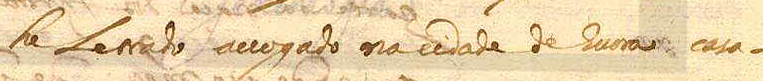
he Letrado auogado na cidade de Euora casa
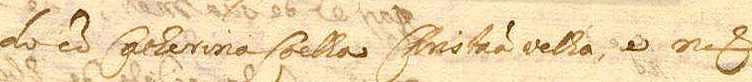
do cō Catherina Coelha Christaã velha, e naõ
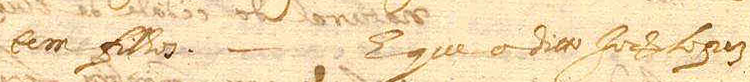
tem filhos. ‒ E que o ditto Joaõ Lopez
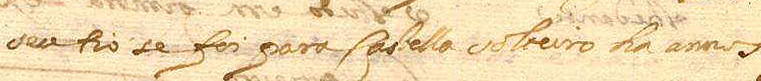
seu tio se foi para Castella solteiro ha annos
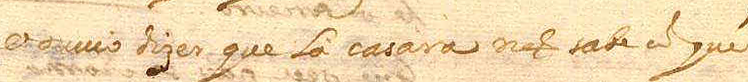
e ouuio dizer que la casara naõ sabe cō quē
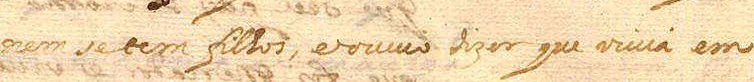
nem se tem filhos, e ouuio dizer que viuia em
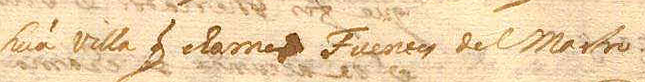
huā villa q̄ chama_ Fuentes del Mastro.
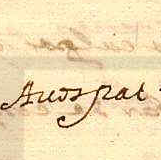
Auos pat.
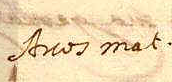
Auos mat.
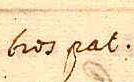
tios pat.
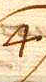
4
